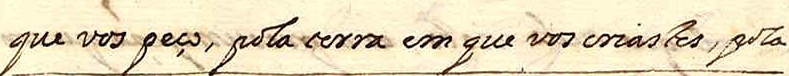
que vos peço, pola terra em que vos criastes, pola
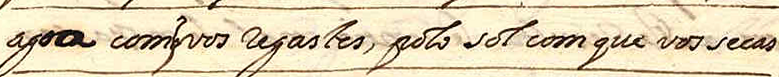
agoa com q̄ vos regastes, polo sol com que vos secas
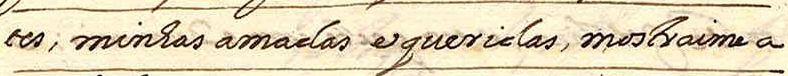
tes, minhas amadas e queridas, mostraime a
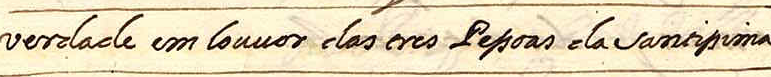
verdade em louuor das tres Pessoas da Santissima
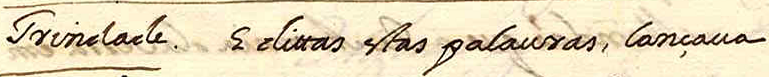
Trindade. E dittas estas palauras, lançaua
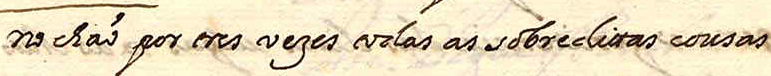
no chaõ por tres vezes todas as sobredittas cousas
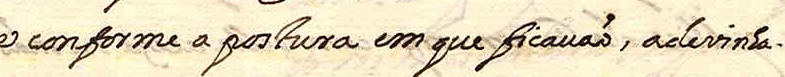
e conforme a postura em que ficauaõ, adevinha
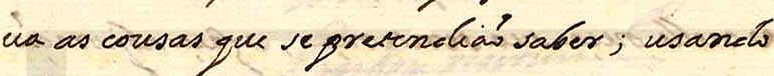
ua as cousas que se pretendiaõ saber; usando
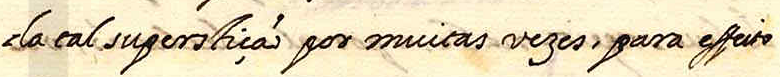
da tal superstiçaõ por muitas vezes, para effeito
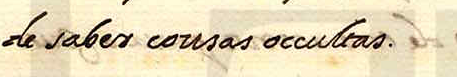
de saber cousas occultas.
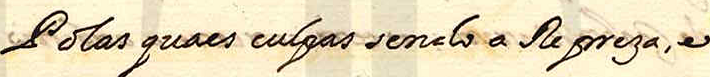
Polas quaes culpas sendo a Re preza, e
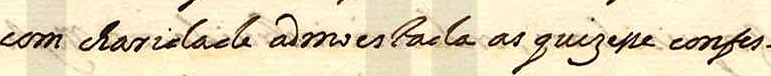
com charidade admoestada as quizesse confes
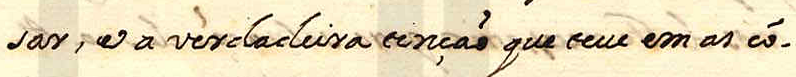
sar, e a verdadeira tençaõ que teue em as cō
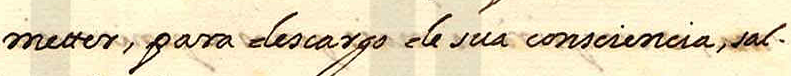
metter, para descargo de sua consciencia, sal
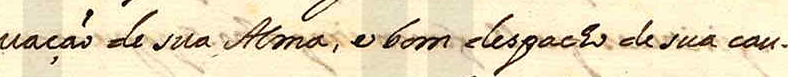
uaçaõ de sua Alma, e bom despacho de sua cau
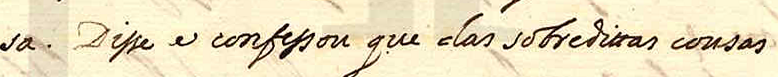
sa. Disse e confessou que das sobredittas cousas
